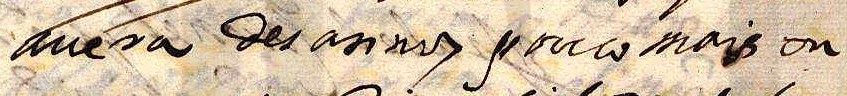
auera des annos pouco mais ou
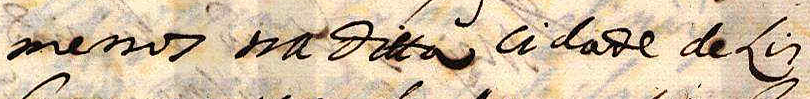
menos na ditta cidade de Lis
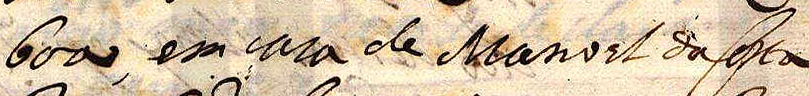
boa em caza de Manoel da Costa
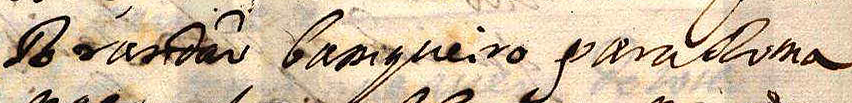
Brandaõ bamqueiro para Roma
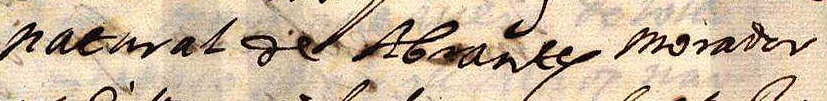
natural de Abrantes morador
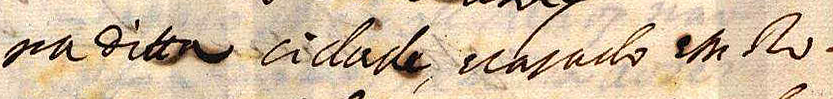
na ditta cidade, E casado Em Ro
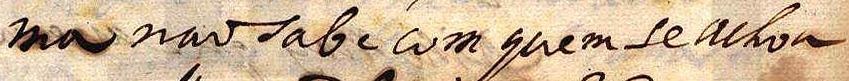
ma naõ sabe com quem se achou
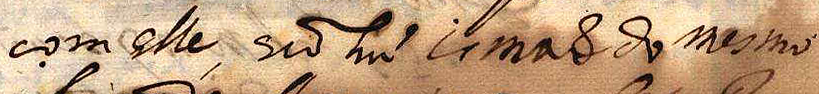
com elle, E cō hū irmaõ do mesmo
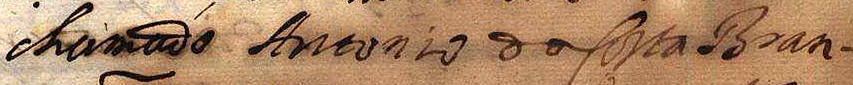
chamado Antonio da Costa Bran
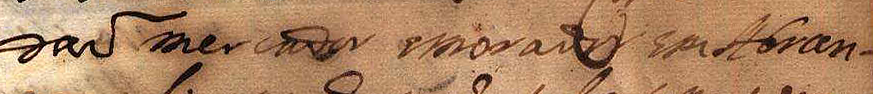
daõ mercador E morador Em Abran
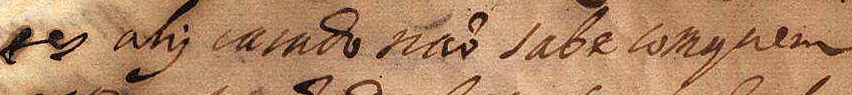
tes ahj casado naõ sabe com quem
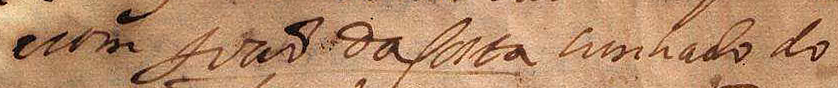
e com Joaõ da Costa cunhado do
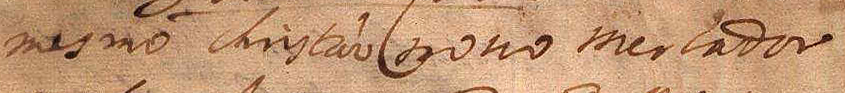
mesmo christaõ nouo mercador
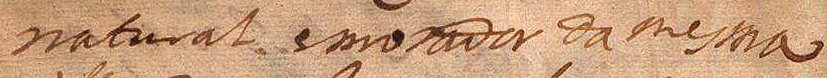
natural e morador da mesma
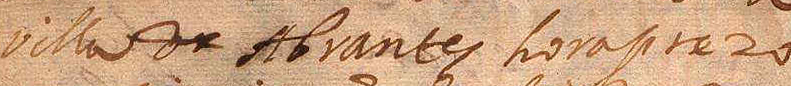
villa de Abrantes hora prezo
